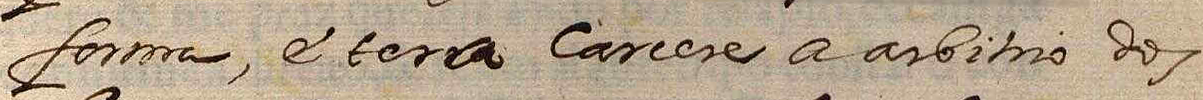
forma, & tera carcere a arbitrio dos
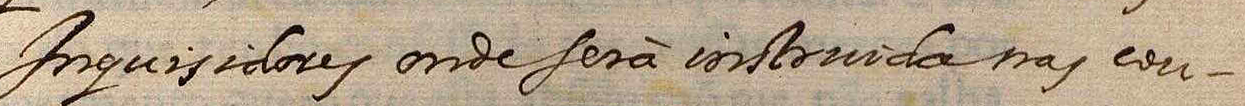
Jnquisidores onde será instruida tras cou
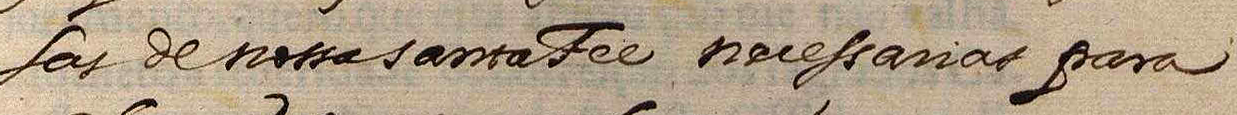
sas de nossa santa Fee necessarias para
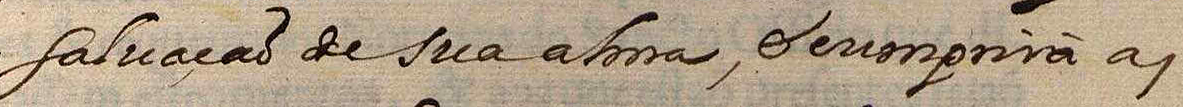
saluaçaõ de sua alma, & cumprirá as
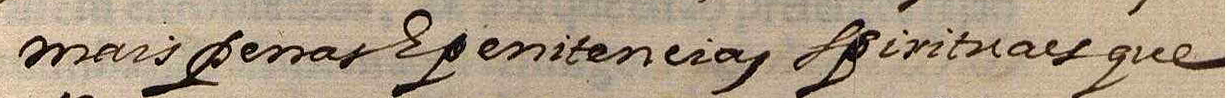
mais penas E penitencias spirituaes que
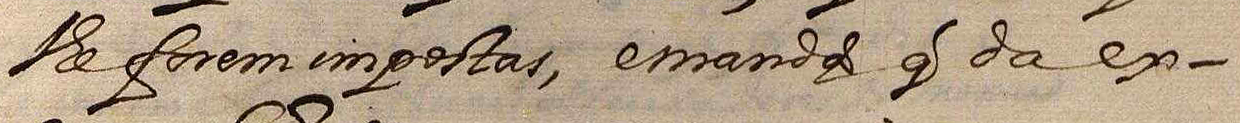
lhe forem impostas, e mandaõ q̄ da ex
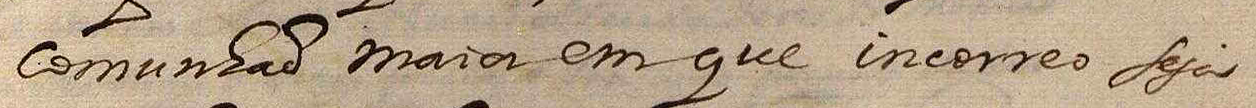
comunhaõ maior em que incorreo seja
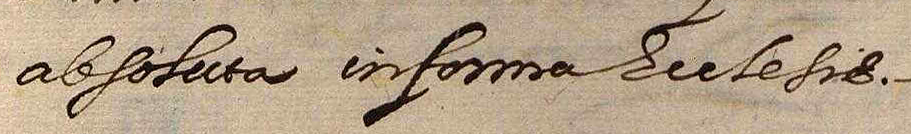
absoluta in forma Ecclesiæ.
